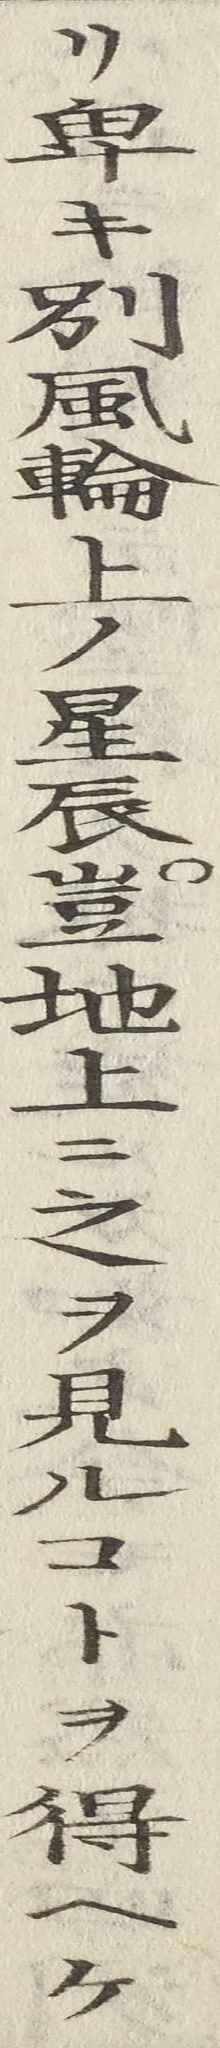リ卑キ別風輪上ノ星辰。豈地上ニ之ヲ見ルコトヲ得ヘケ
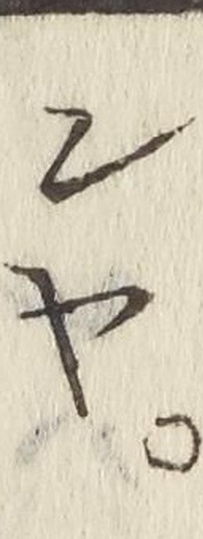ンヤ。
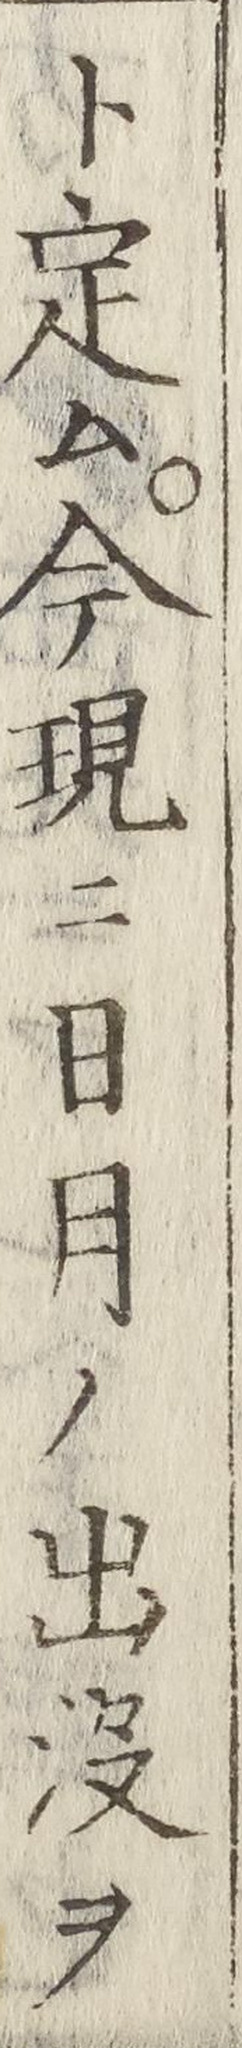ト定ム。今現ニ日月ノ出没ヲ
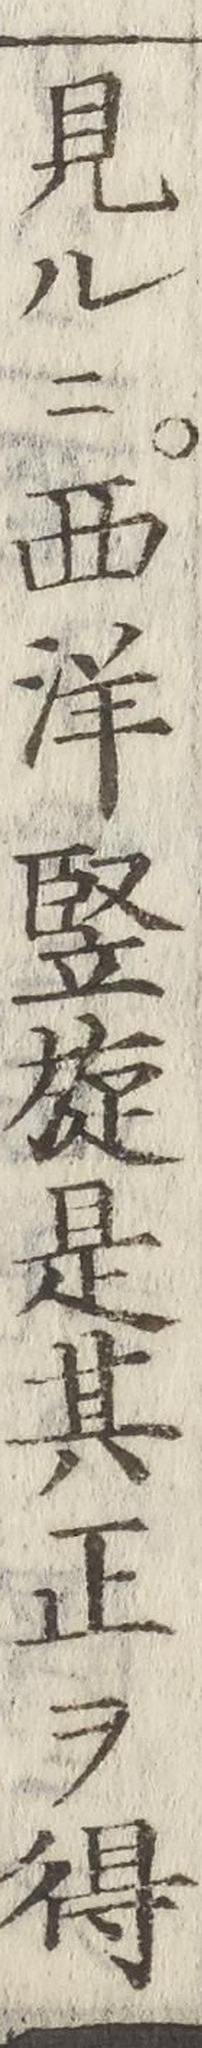見ルニ。西洋竪旋是其正ヲ得
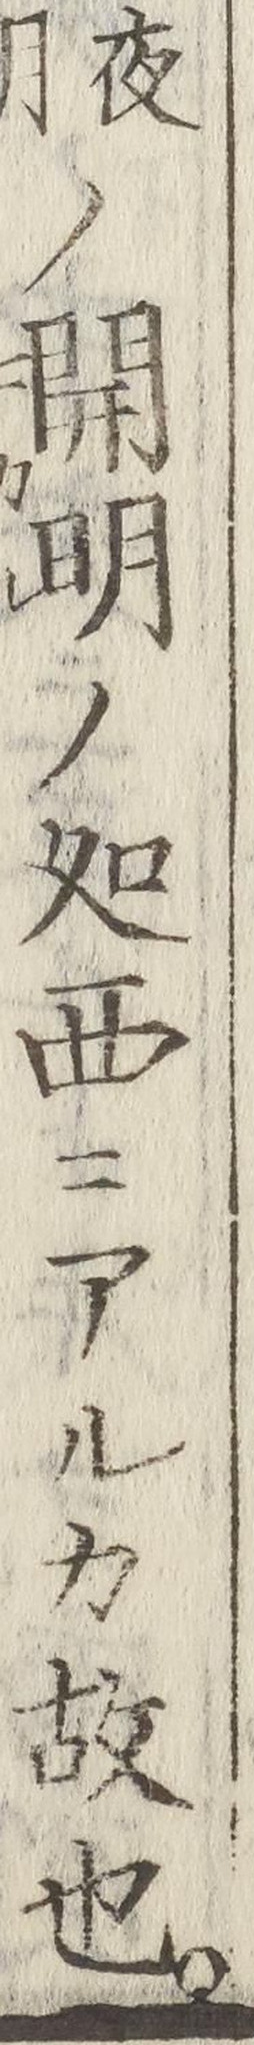夜月ノ開明ノ処西ニアルカ故也。
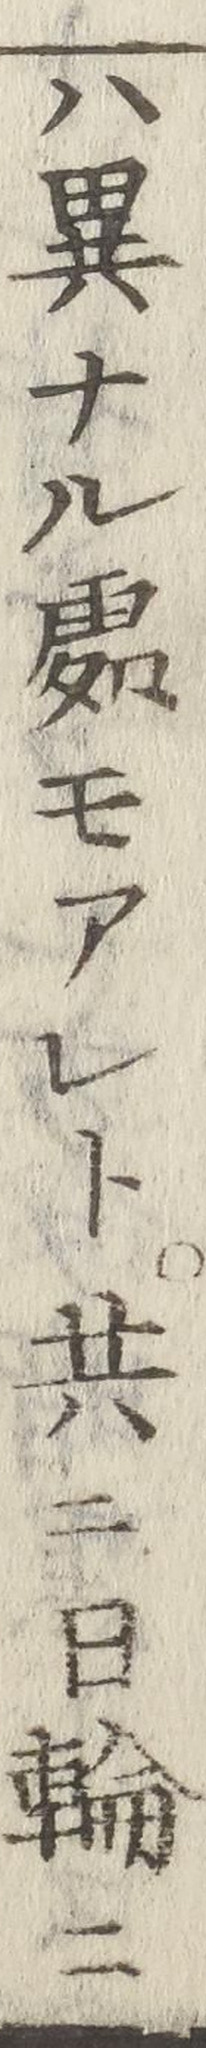ハ異ナル処モアレト。共ニ日輪ニ

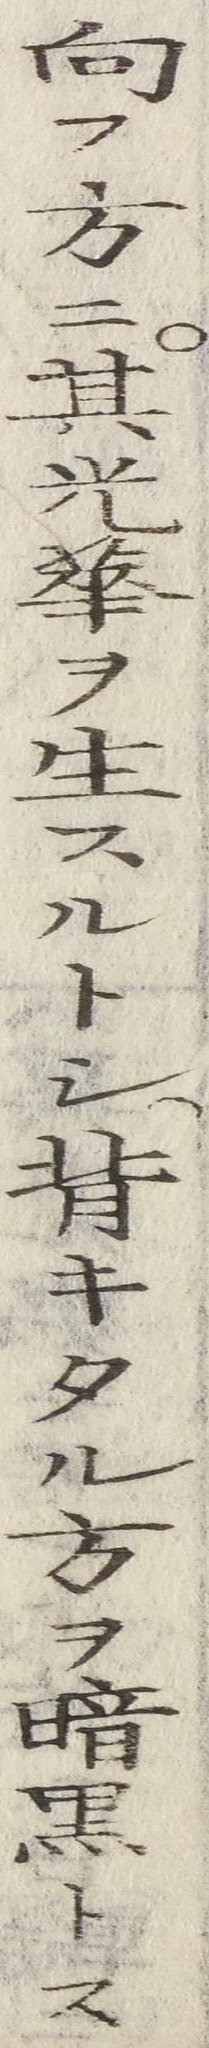向フ方ニ。其光華ヲ生スルトシ。背キタル方ヲ暗黒トス
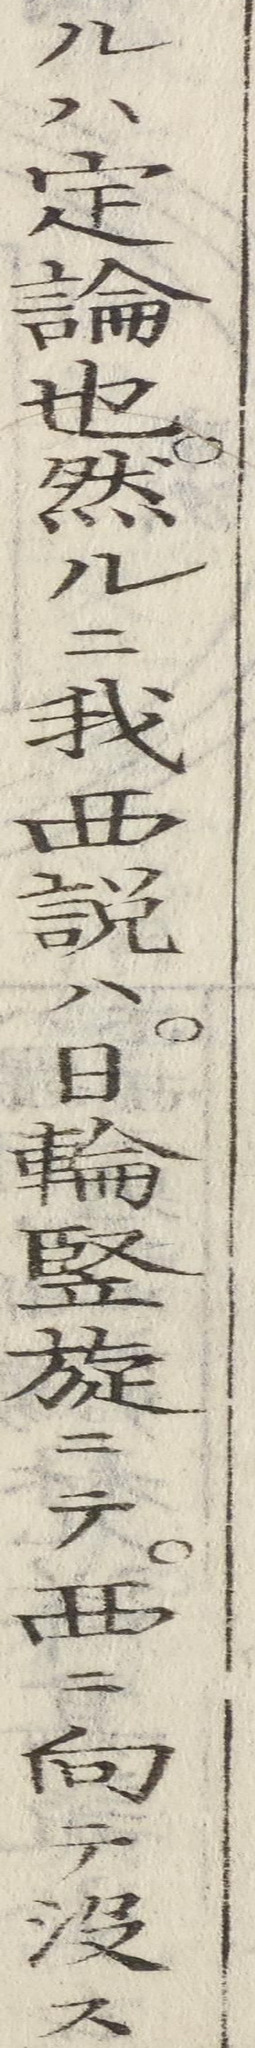ルハ定論也。然ルニ我西説ハ。日輪竪旋ニテ。西ニ向テ没ス
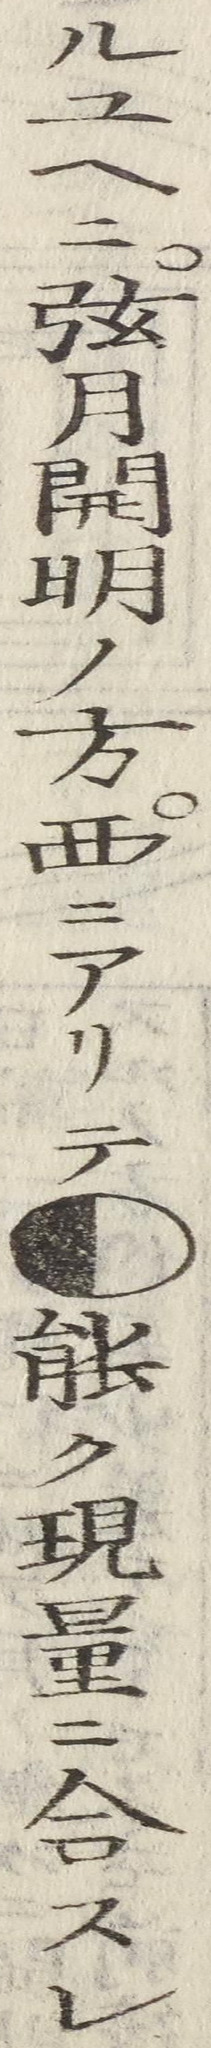ルユヘニ。弧月開明ノ方。西ニアリテ🌓能ク現量ニ合スレ
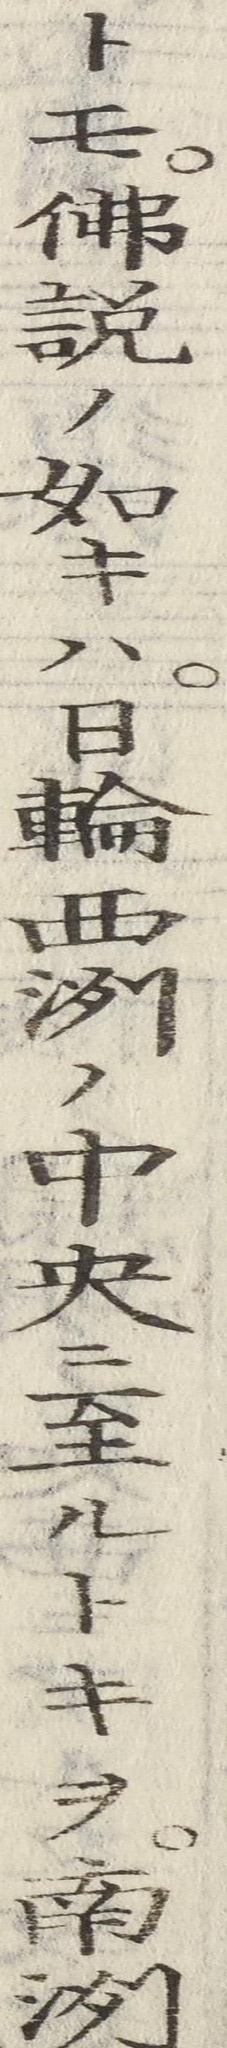トモ。仏説ノ如キハ。日輪西洲ノ中央ニ至ルトキヲ。南洲
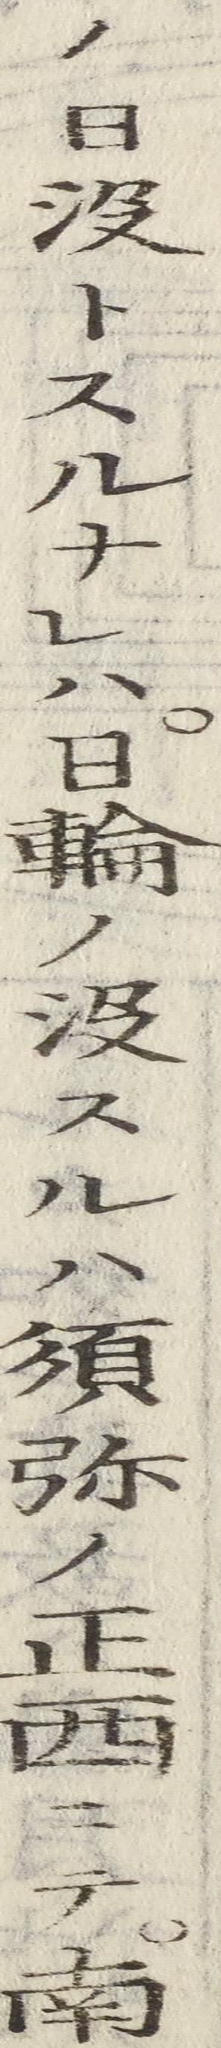ノ日没トスルナレハ。日輪ノ没スルハ須弥ノ正西ニテ。南
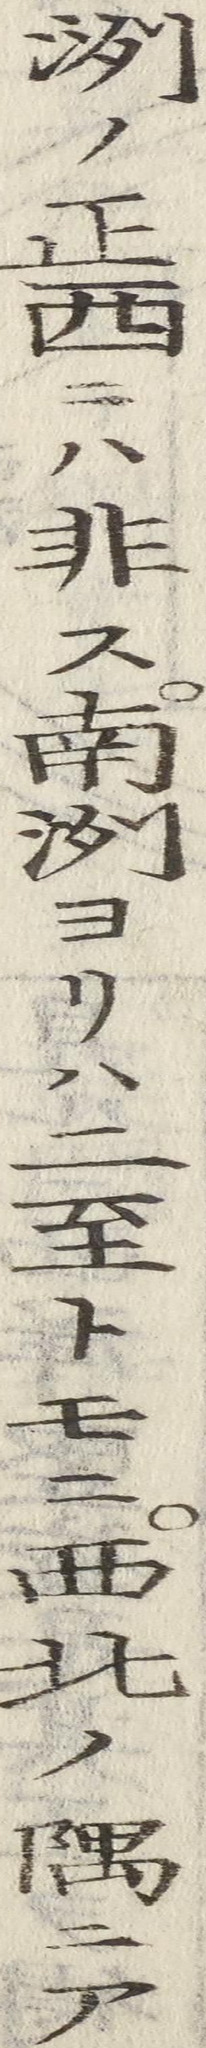洲ノ正西ニハ非ス。南洲ヨリハニ至トモニ。西北ノ隅ニア
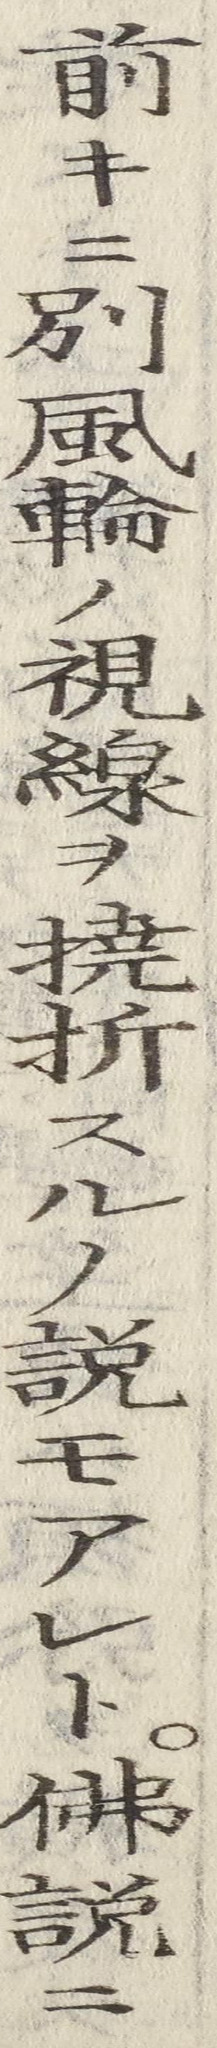前キニ別風輪ノ視線ヲ撓折スルノ説モアレト。仏説ニ
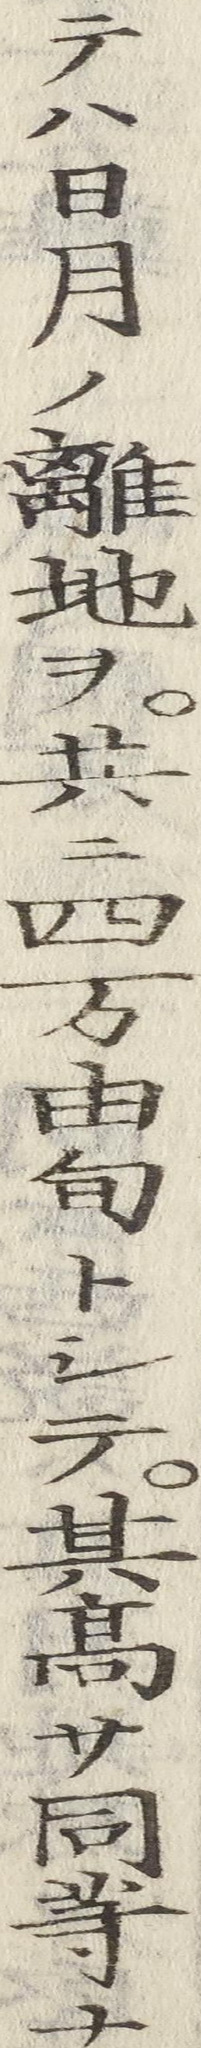テハ日月ノ離地ヲ。共ニ四万由旬トシテ。其高サ同等ナ
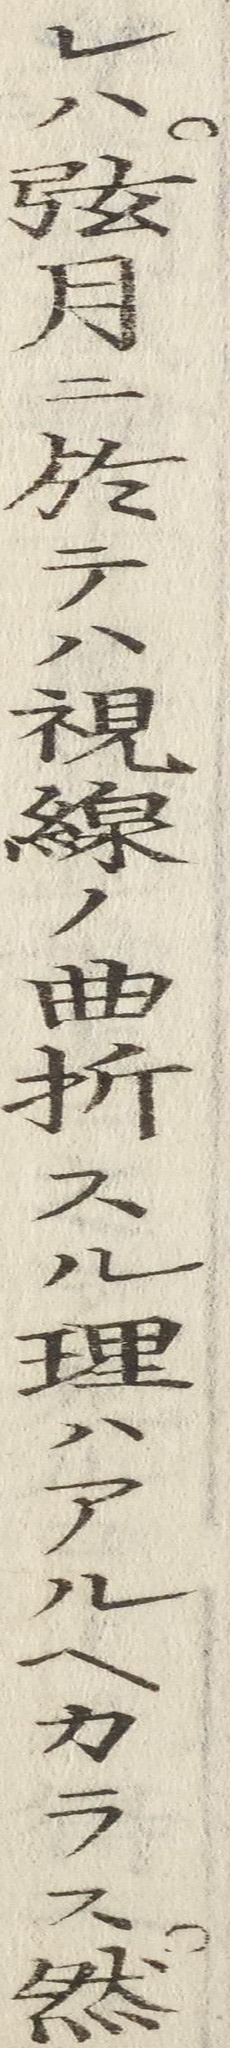レハ。弧月ニ於テハ視線ノ曲折スル理ハアルヘカラス。然
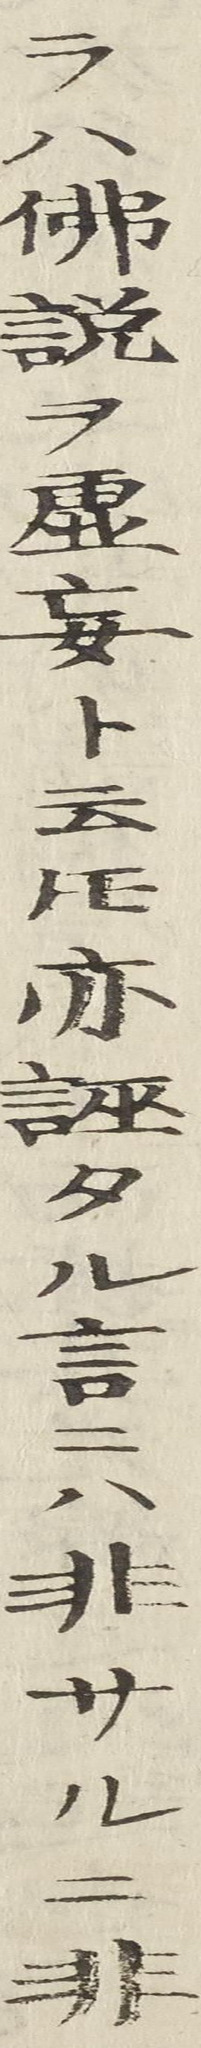ラハ仏説ヲ虚妄ト云トモ亦誣タル言ニハ非サルニ非
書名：護法新論　二編　上
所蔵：東京大学地震研究所図書室 Earthquake Research Institute Library, The University of Tokyo, JAPAN
